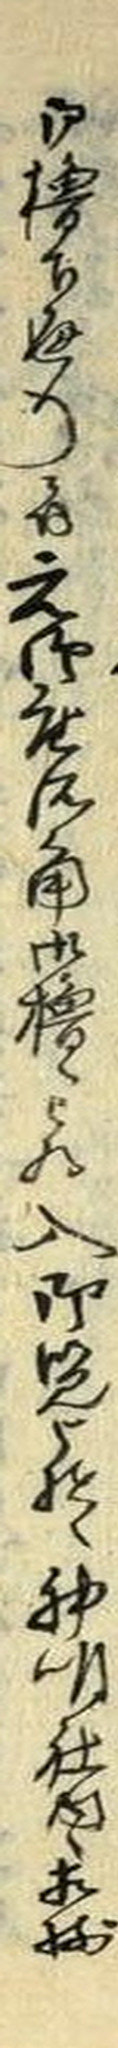御櫓下通行ニ付元御座所角御櫓へ被為入御覧被遊候神明社内へ相揃
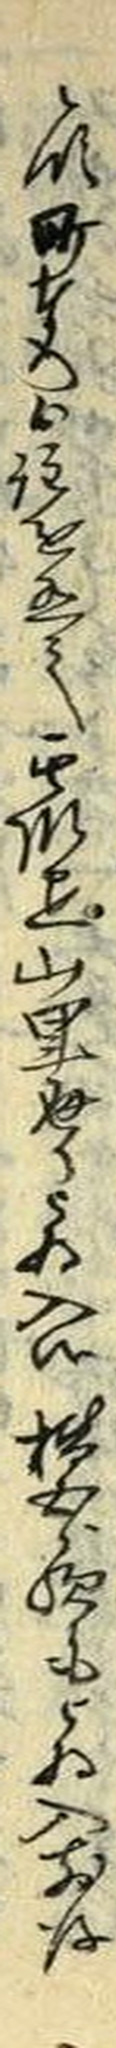候段町奉行ゟ注進有之其段申上山里通り被為入候楷五郎様も被為入前後
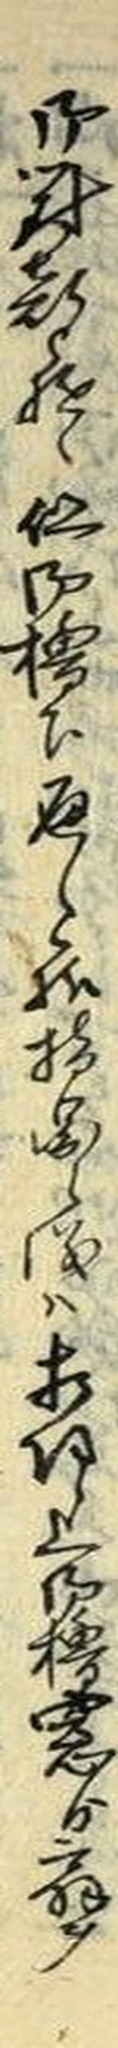御対顔被遊候但御櫓下通り候様指図之儀ハ相伺之上御櫓窓ゟ扇ヲ
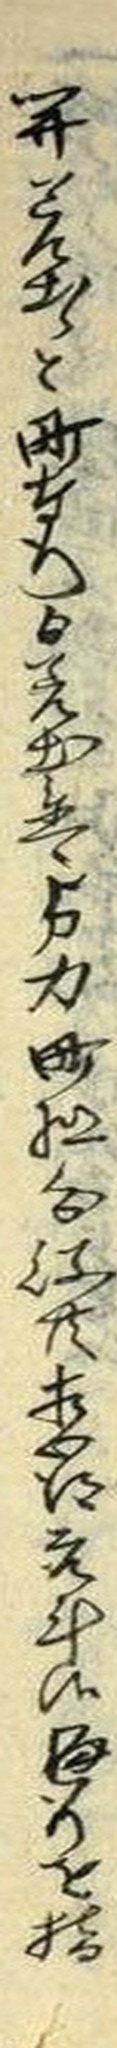開差出候と町奉行ゟ差出置候与力町組分役共相心得取斗候通行を指
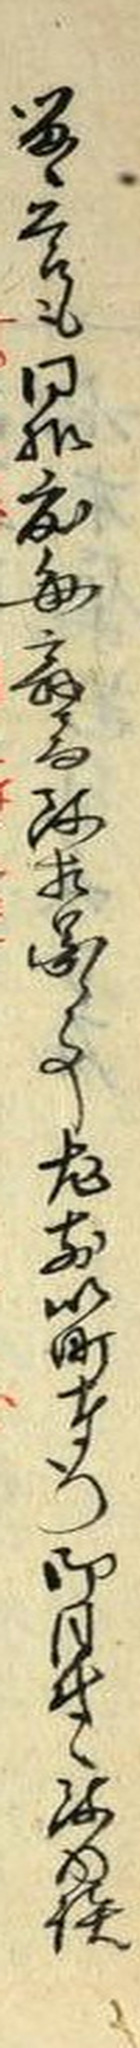留候節も同様度毎扇ニ而致相図候事尤前以町奉行御目付へ致内談
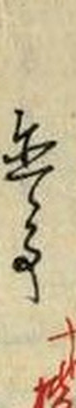置候事
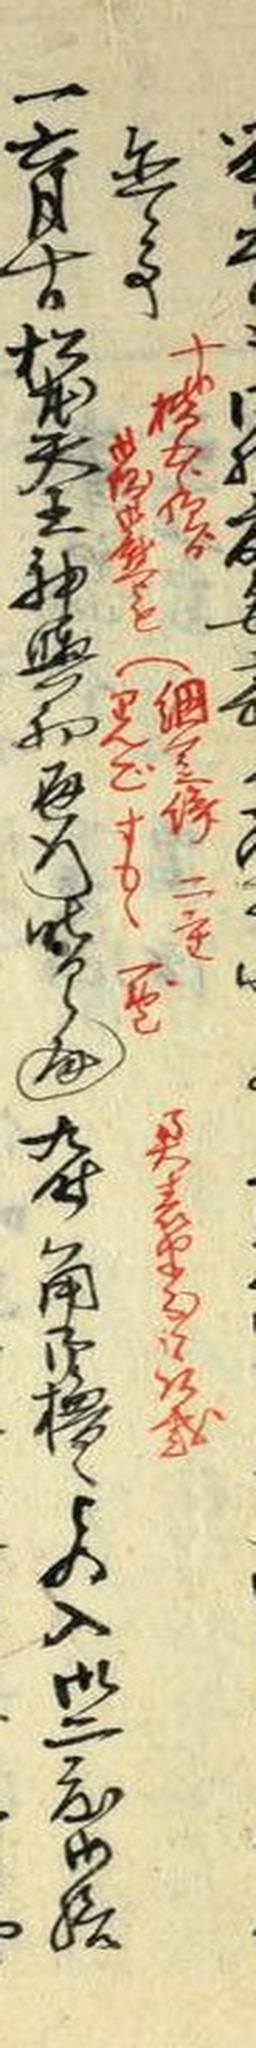一六月十日松本天王神輿初通行昨日之通九時角御櫓へ被為入御二度御膳
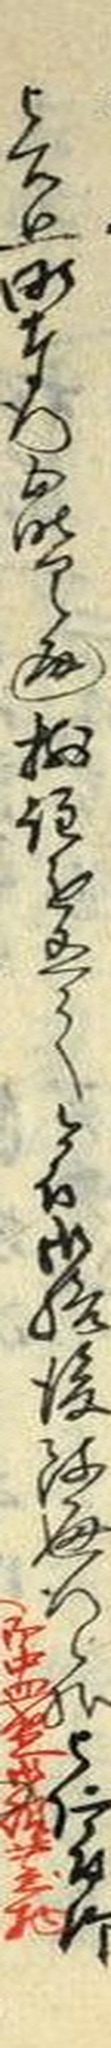被召上町奉行ゟ昨日之通揃注進有之ニ付御膳後致通行候様被仰付御
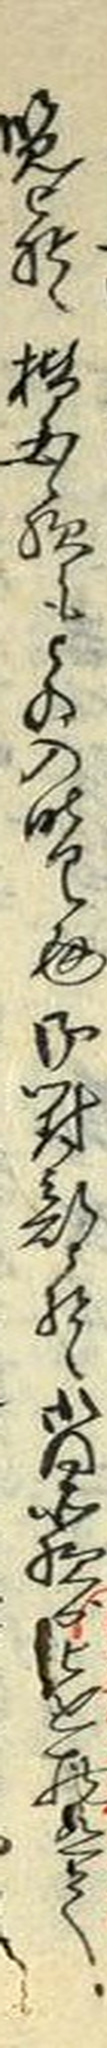覧被遊候楷五郎様ニも被為入昨日之通御対顔被遊候御同所様ゟ被進物有之
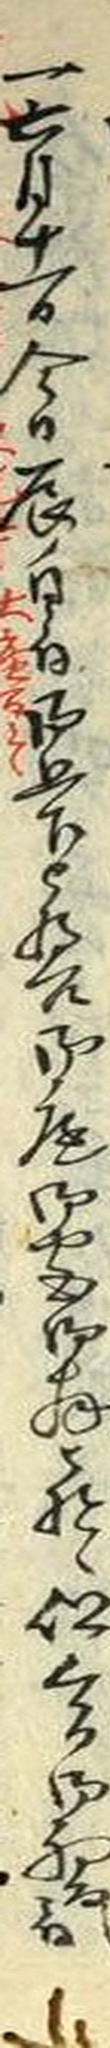一六月十一日今日辰ノ日ニ付御上下被為召御庭御宮御拝被遊候但今日御初而ニ付
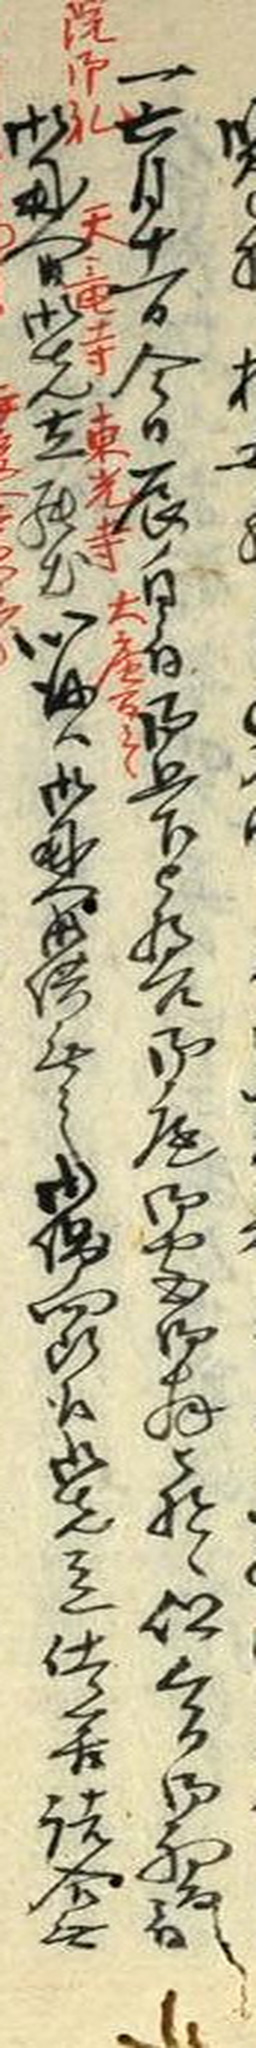御用人御先立罷出以後ハ御用人御供無之御側向頭取御先立仕候筈詰合無
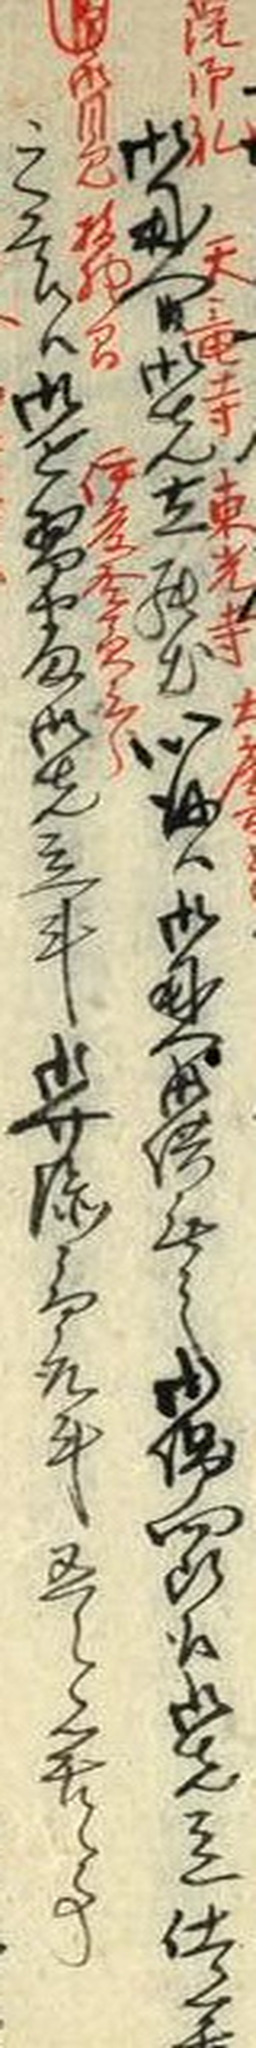之節ハ御近習番御先立斗御介添ニ而取斗有之筈候事
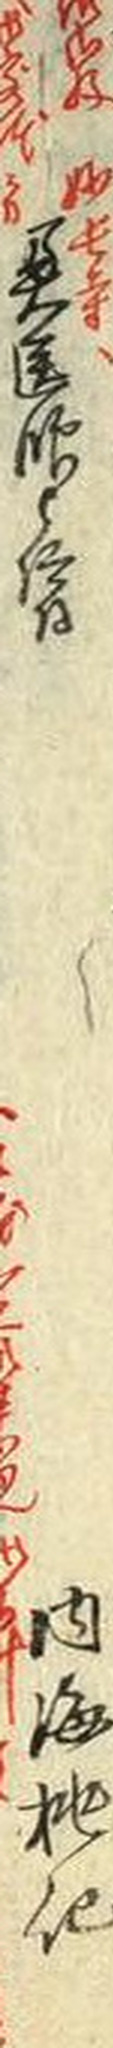奥医師被仰付内海桃仙
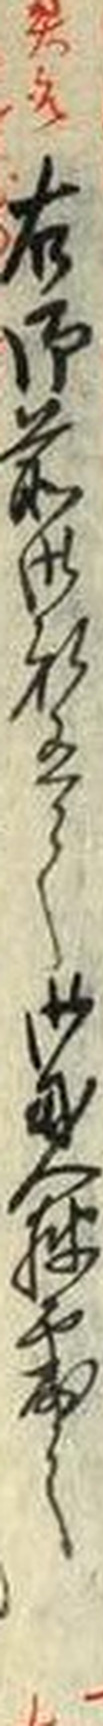右御前御礼有之御用人披露之
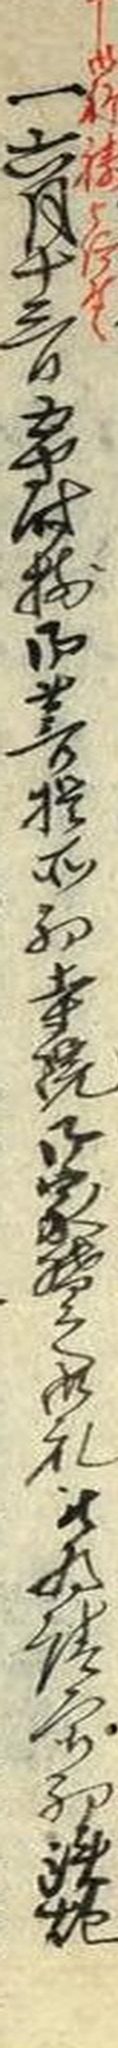一六月十三日五半時揃御菩提所初寺院御家督之御礼被為請最初鉄炮
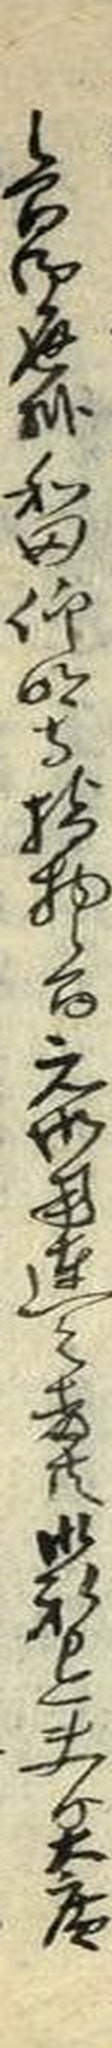之間御通掛和田仰明寺指物之間元御用達之者共御礼申上夫ゟ大広
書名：少傅日録抄（斉善付側向頭取日記、江戸并道中、初入在国、逝去後…
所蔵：福井県文書館 Fukui Prefectural Archives
